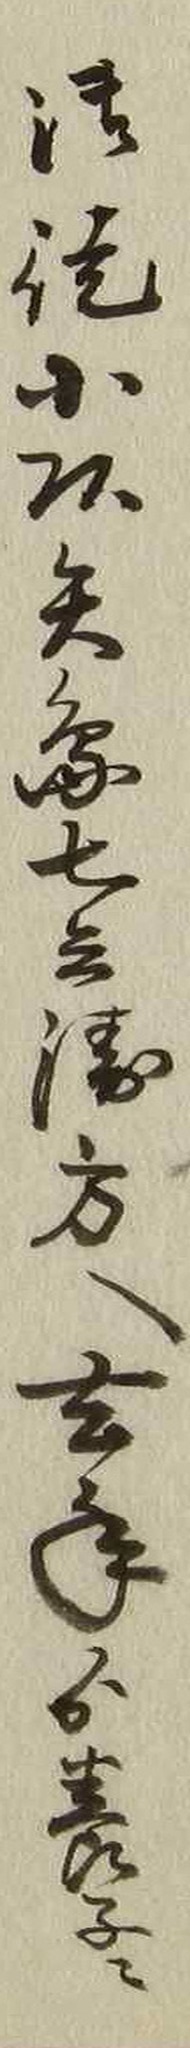御徒小頭矢島七兵衛方へ去年ゟ養子ニ
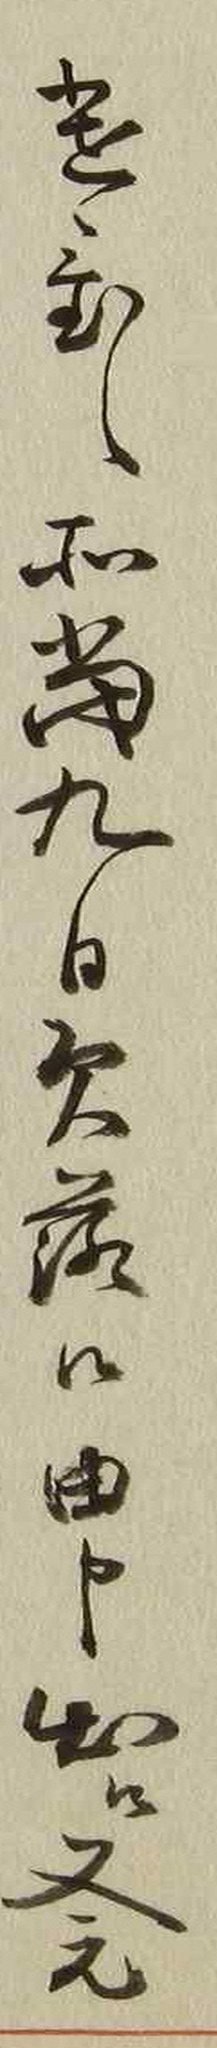遣置候所当九日欠落候由申出候又元
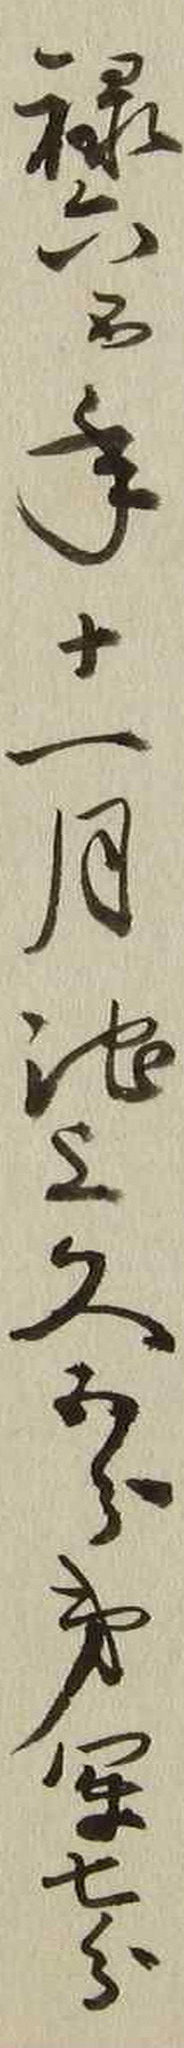禄六酉年十一月池上久五郎弟軍七郎
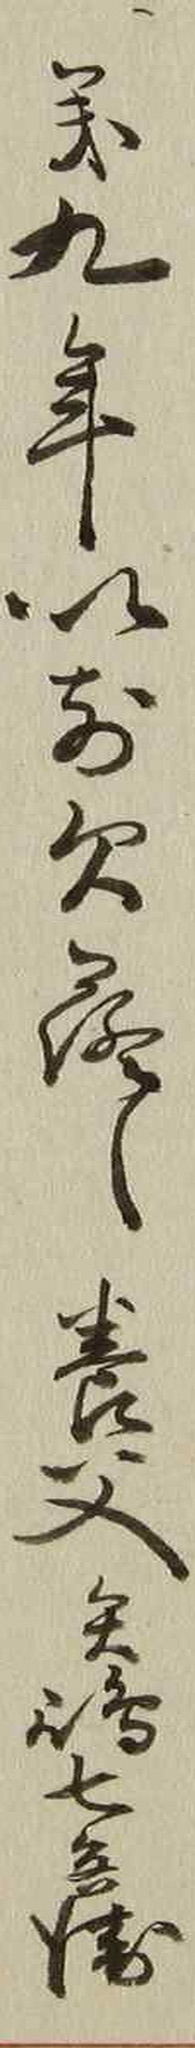義九年以前欠落候養父矢島七兵衛
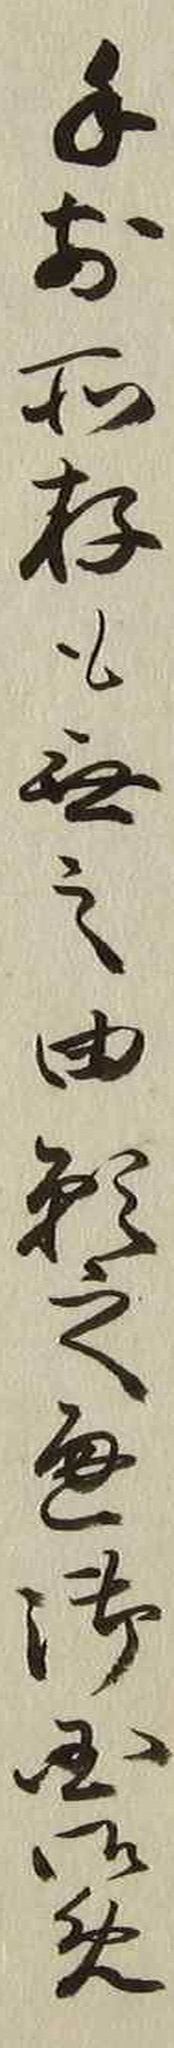手前所存も無之由願之通御国御免
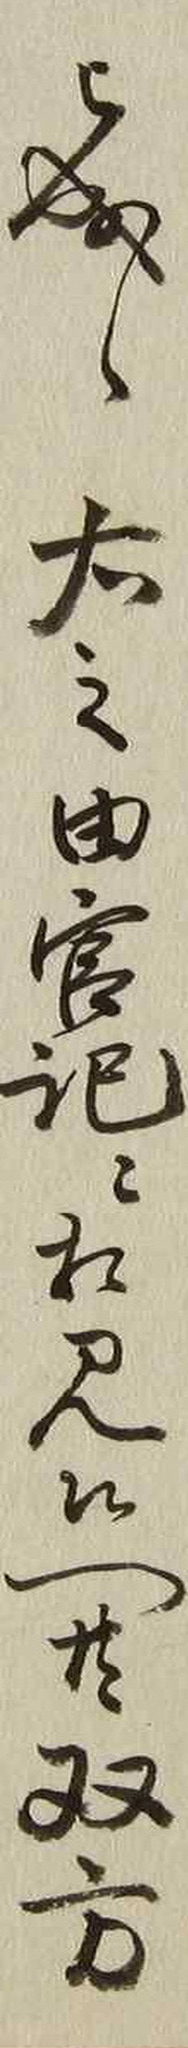被成候右之由官記ニ相見候へ共双方
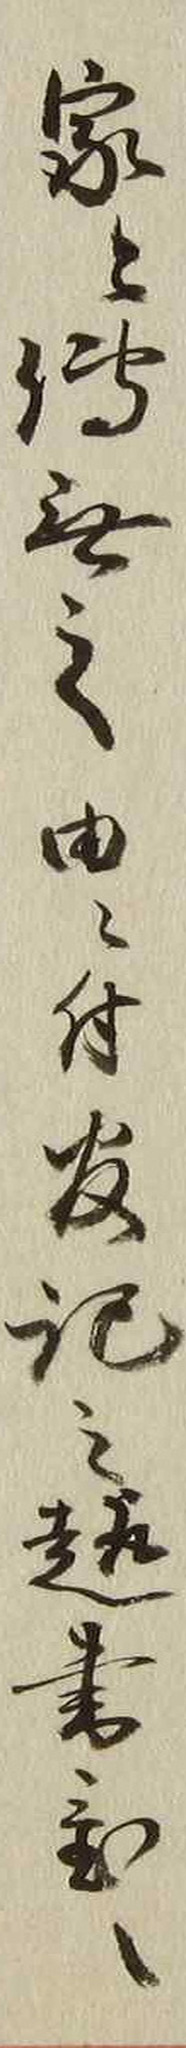家ニ伝無之由ニ付官記之趣書置候
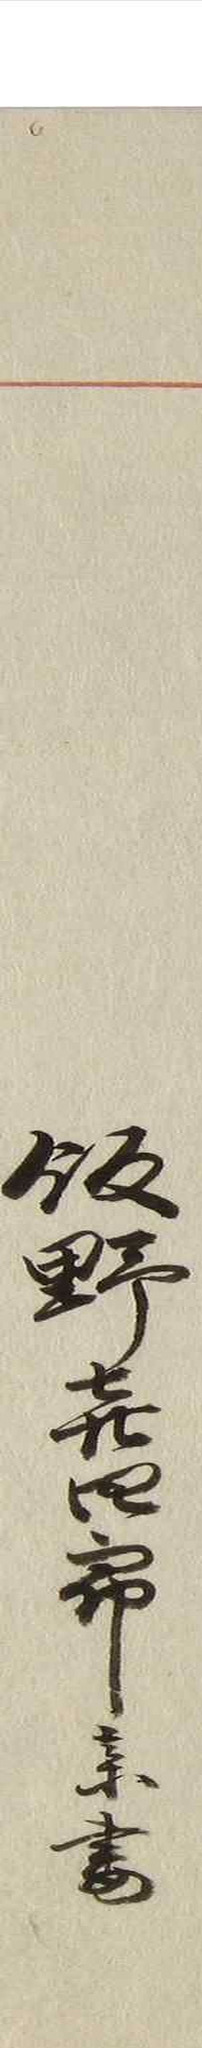飯野喜四郎某妻
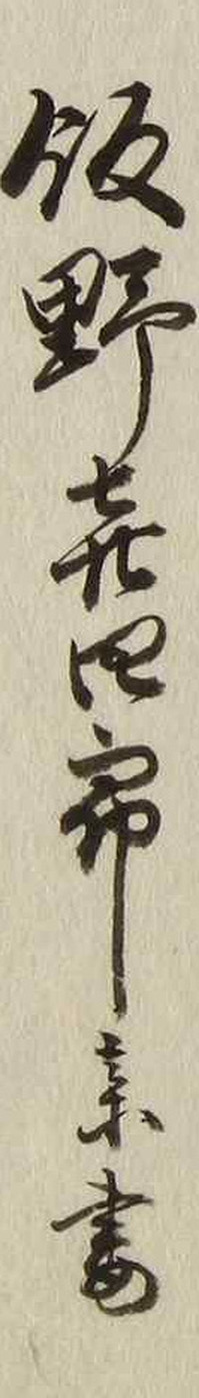飯野喜四郎某妻
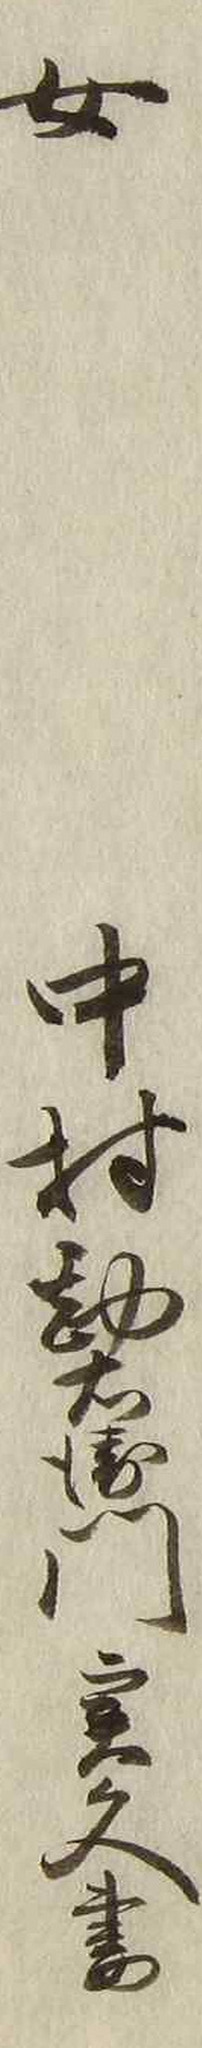女中村勘右衛門実久妻
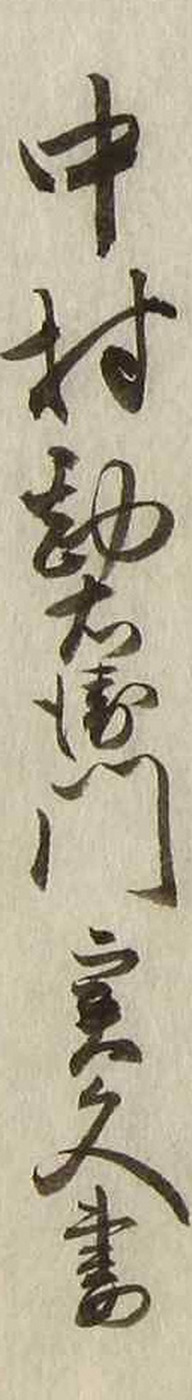女中村勘右衛門実久妻
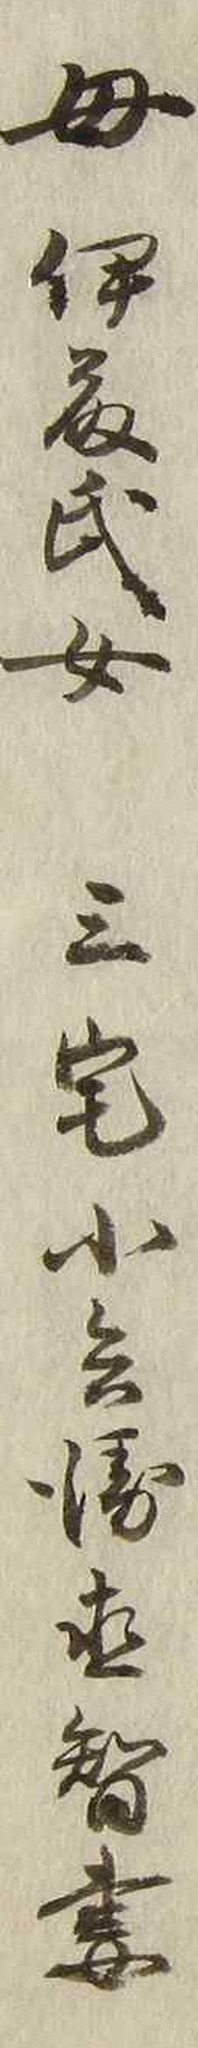母伊藤氏女三宅小兵衛直智妻

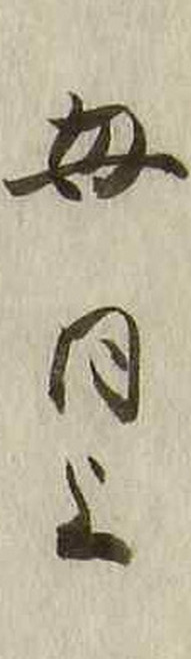母同上
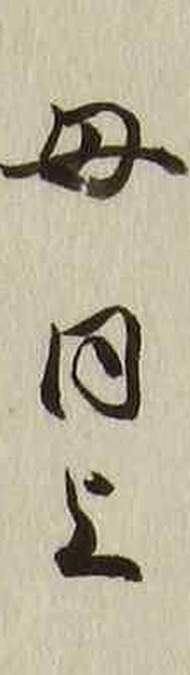母同上
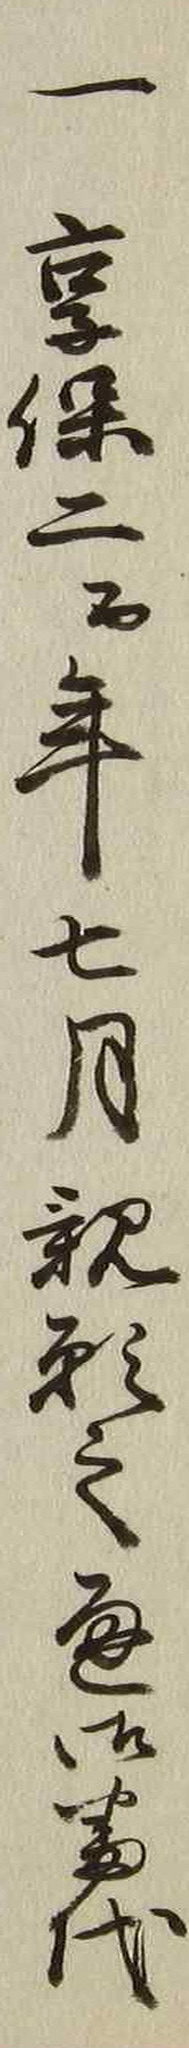一享保二酉年七月親願之通御番代
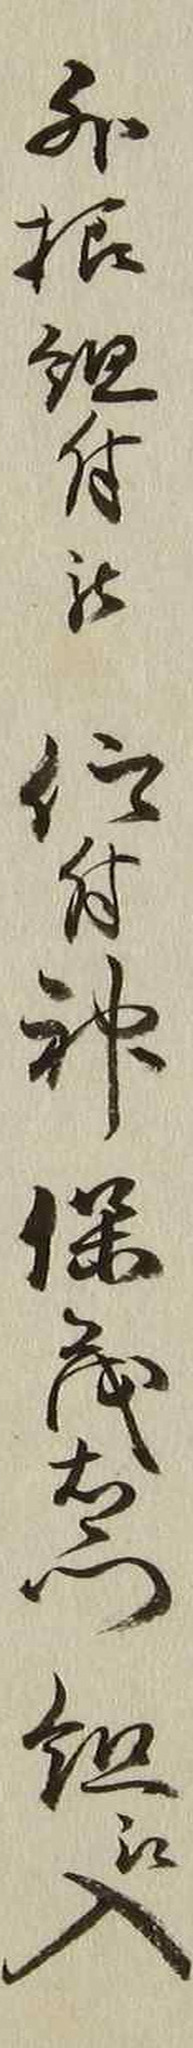外様組付被仰付神保茂右エ門組江入
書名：諸士系譜　巻之15　い之部15
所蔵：会津若松市立会津図書館
